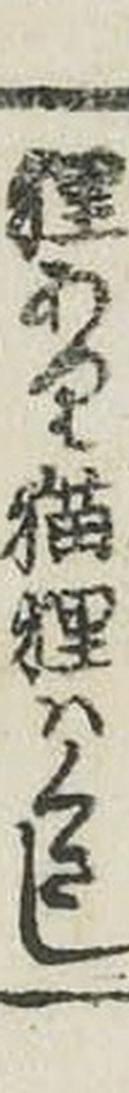狸あり猫狸はくさし
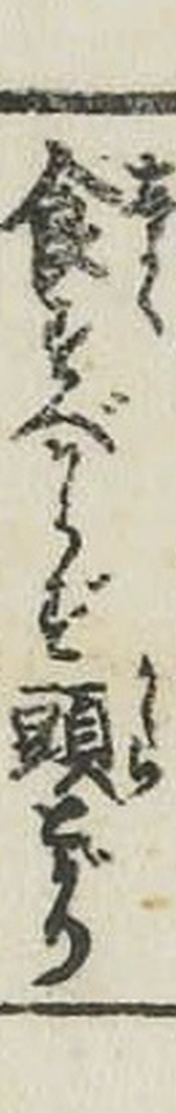食すべからず頭とがり
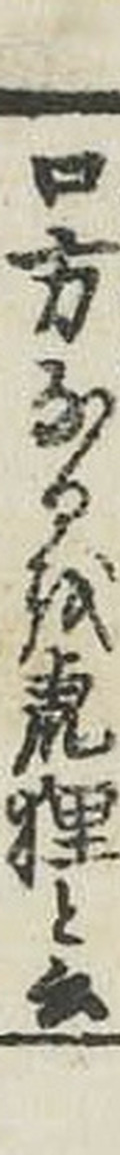口方なるを虎狸と云
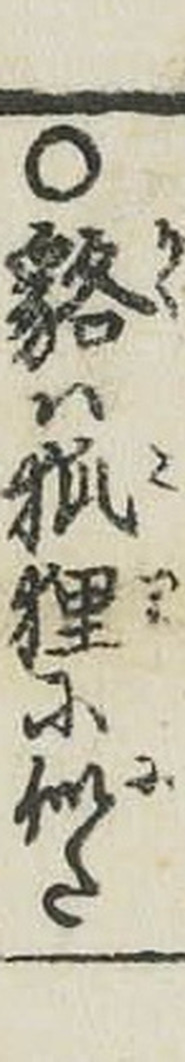○貉は狐狸に似た
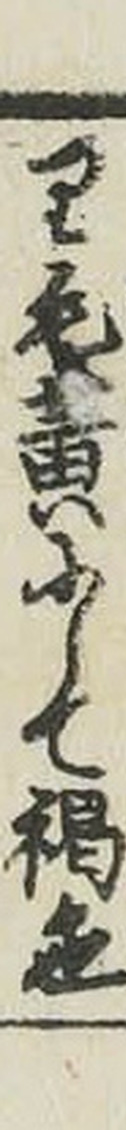り毛黄にして褐色
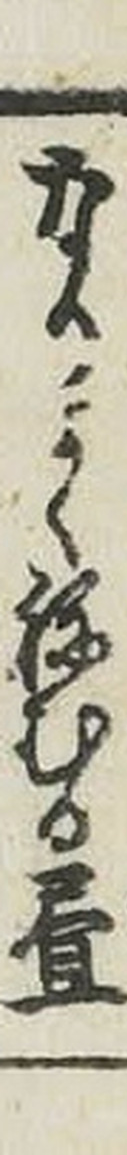なりよくねむる昼
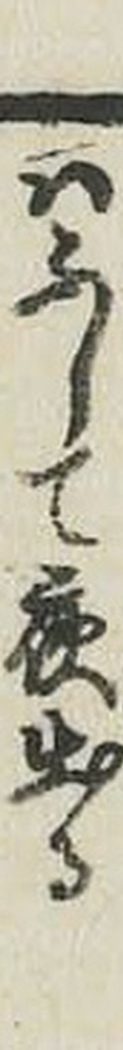はふして夜出る
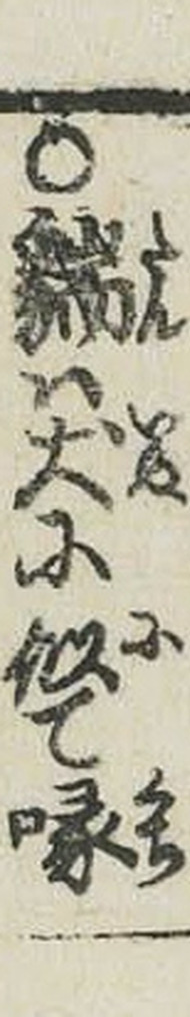○貒は犬に似て吻
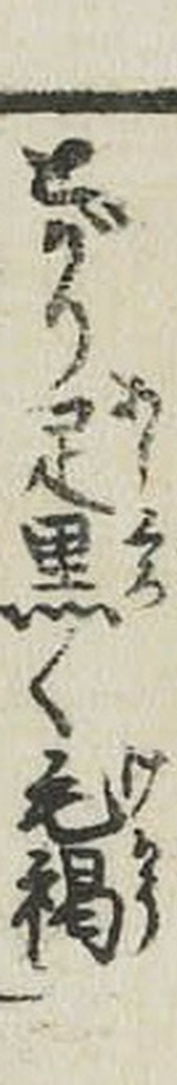とがり足黒く毛褐
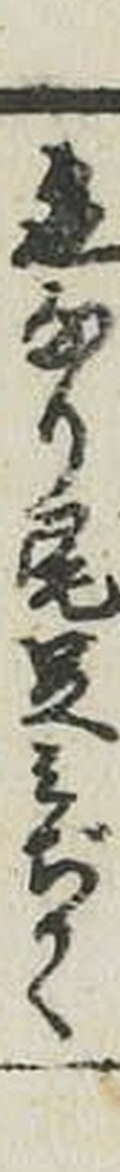色なり尾足みぢかく
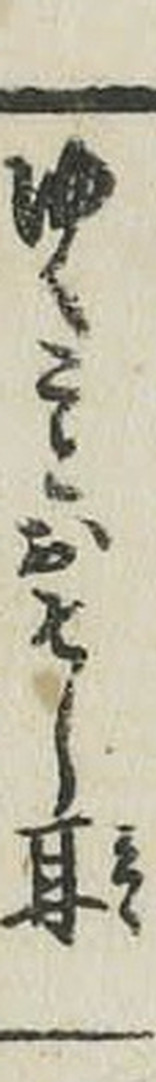ゆくことおそし耳
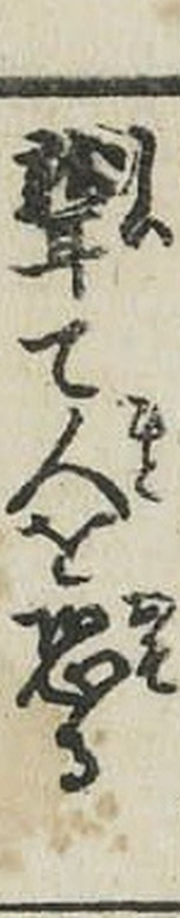聾て人を恐る

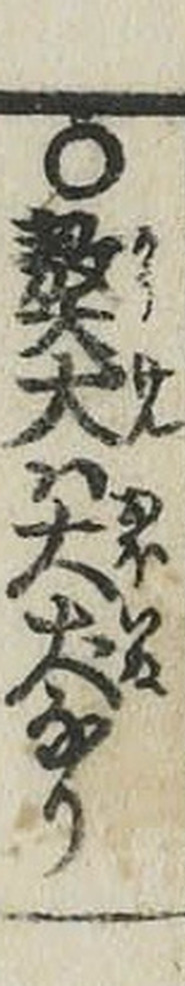○獒犬は大犬なり
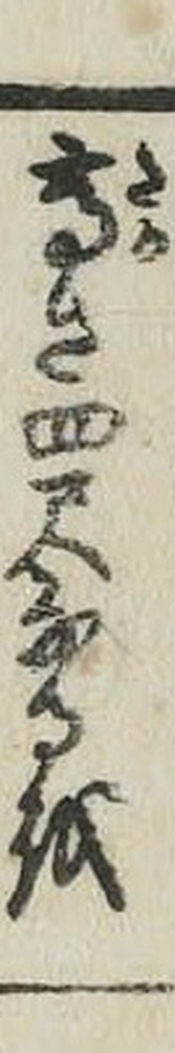高さ四尺なるを
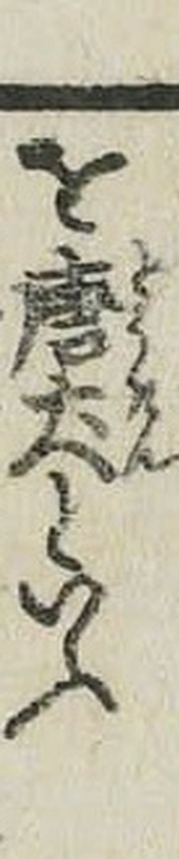を唐犬といふ
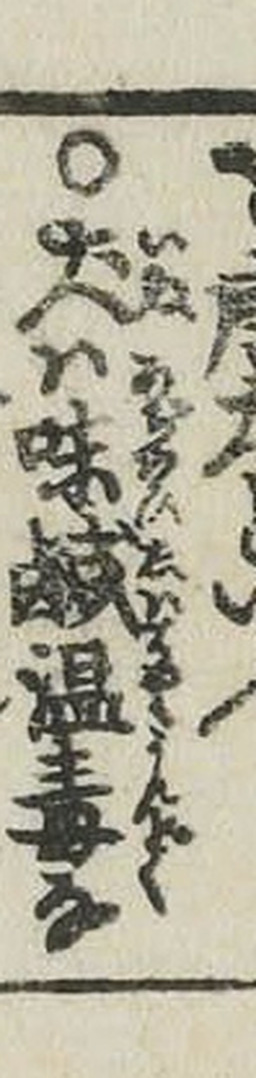○犬は味鹹温毒な
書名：増補頭書訓蒙図彙大成 10巻 6:巻之12-13
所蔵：東京学芸大学教育コンテンツアーカイブ
